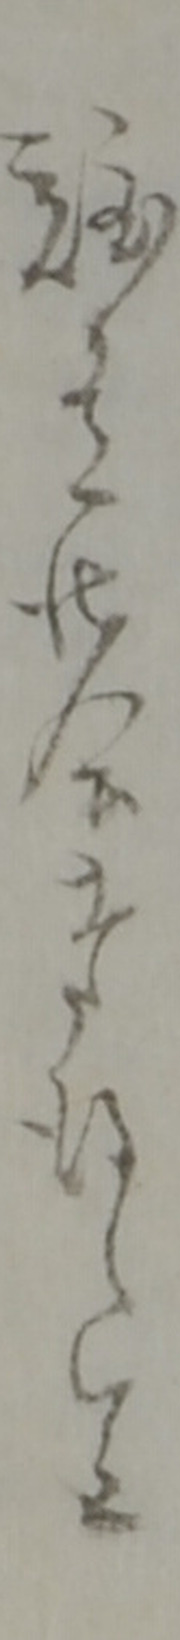難有仕合奉存候以上
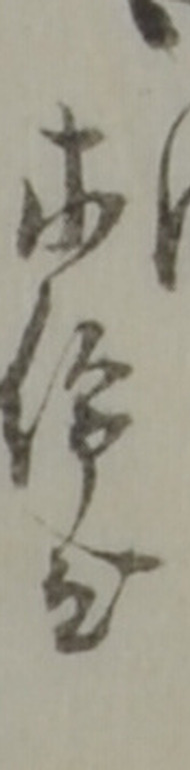木綿屋
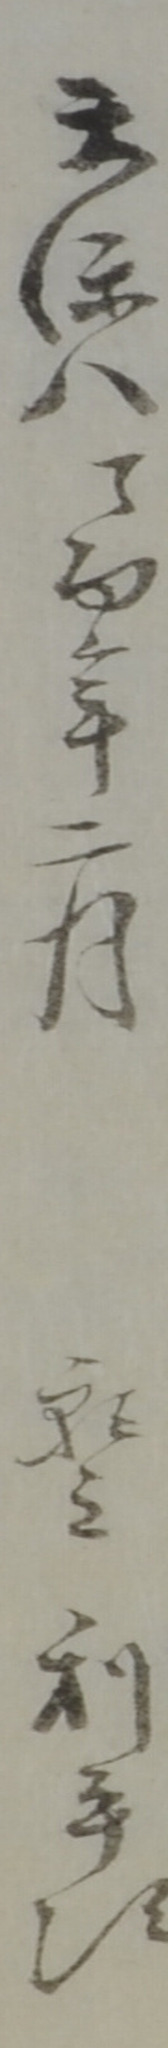天保八丁酉年二月願主利平治
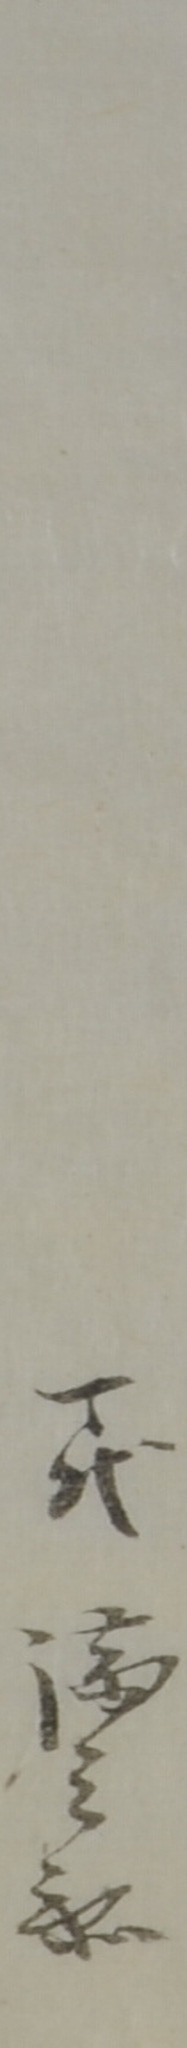町代満兵衛
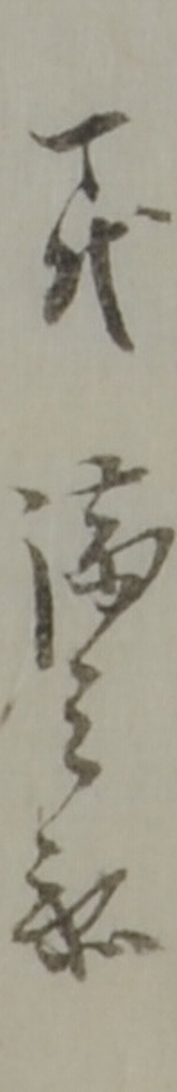町代満兵衛
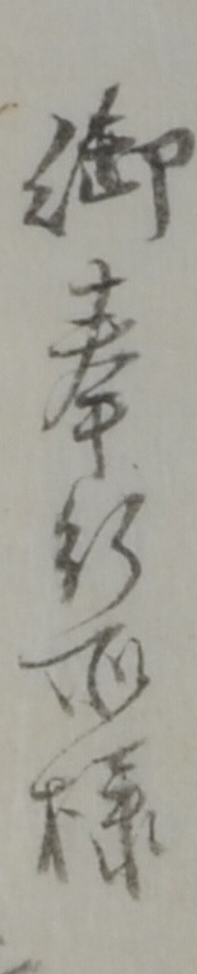御奉行所様

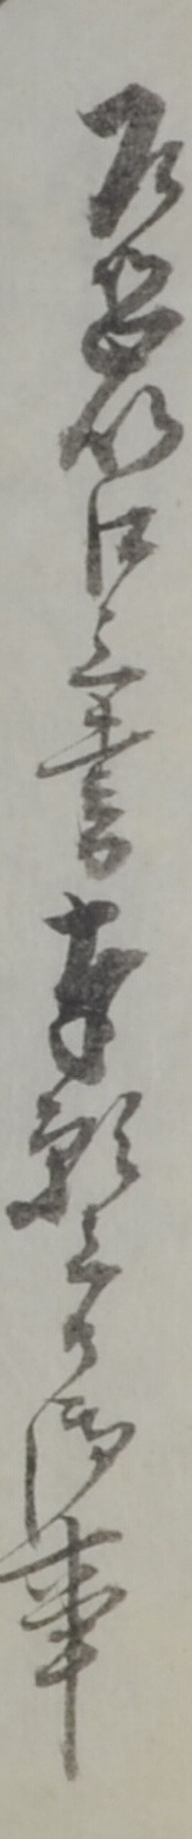乍恐以口上書奉願上候御事
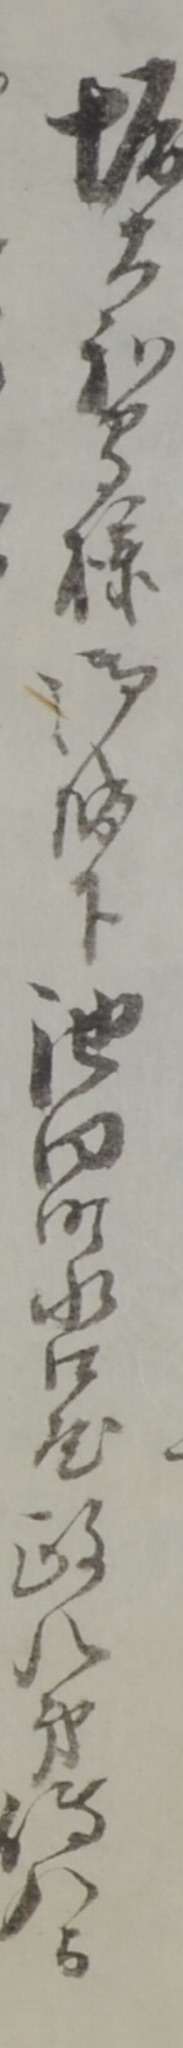堀大和守様御城下池田町水口屋政八弟伝八と
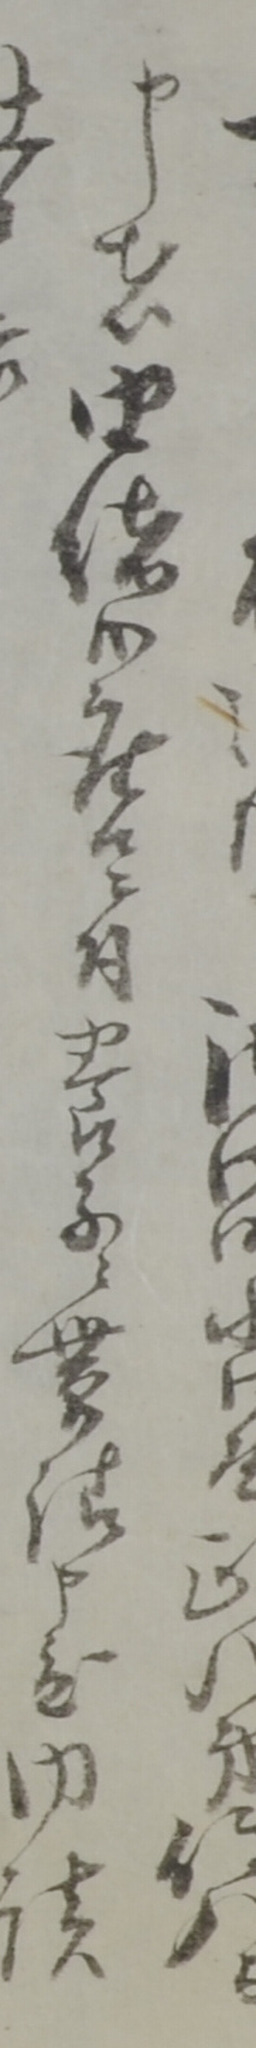申者由緒御座候ニ付養子ニ貰請申度内談
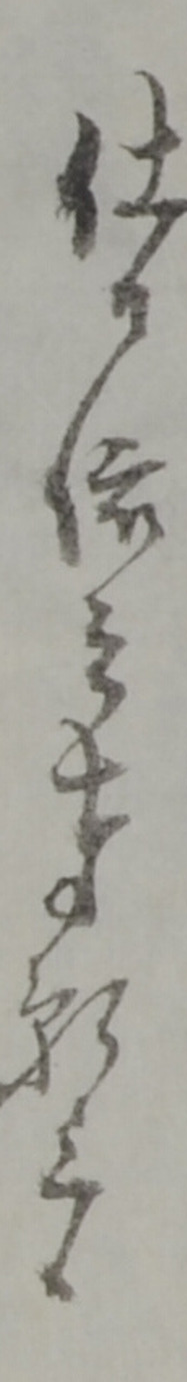仕候依之奉願上候
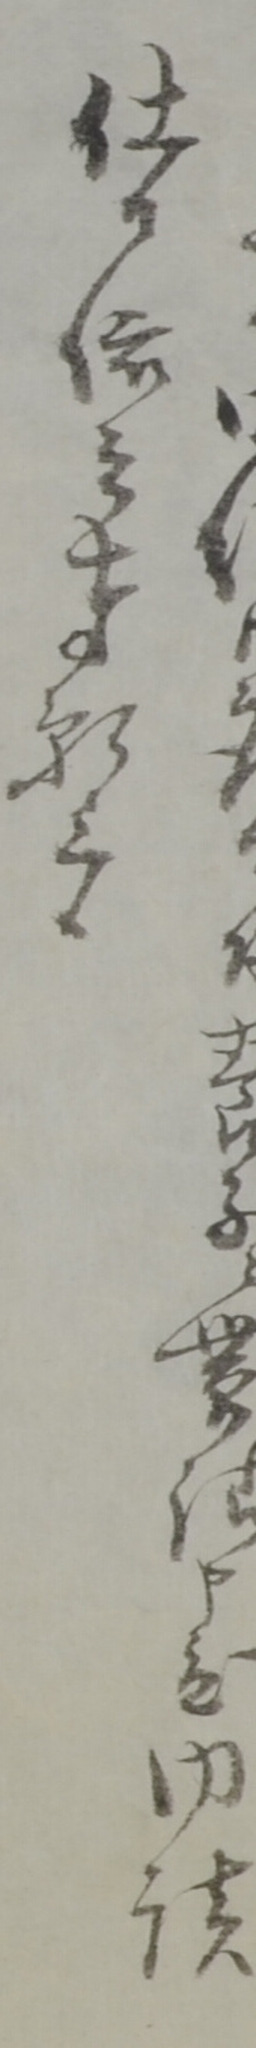仕候依之奉願上候
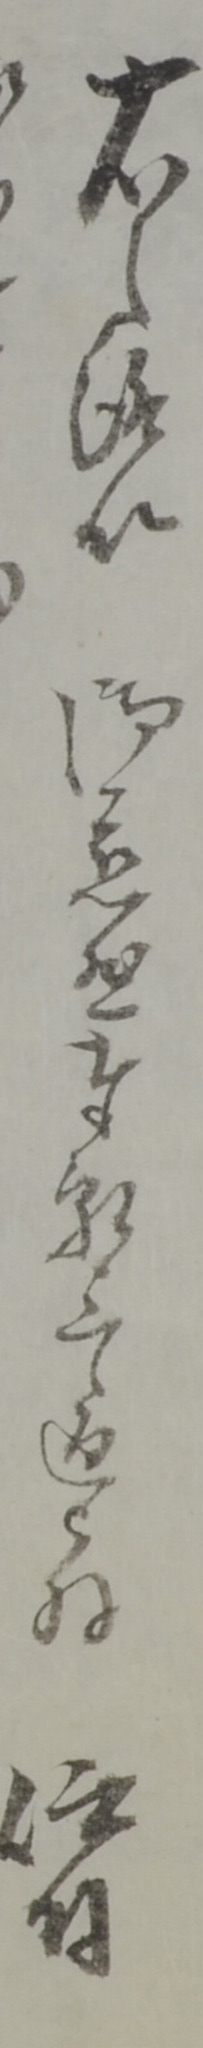右之趣以御慈悲奉願上候通被為仰付
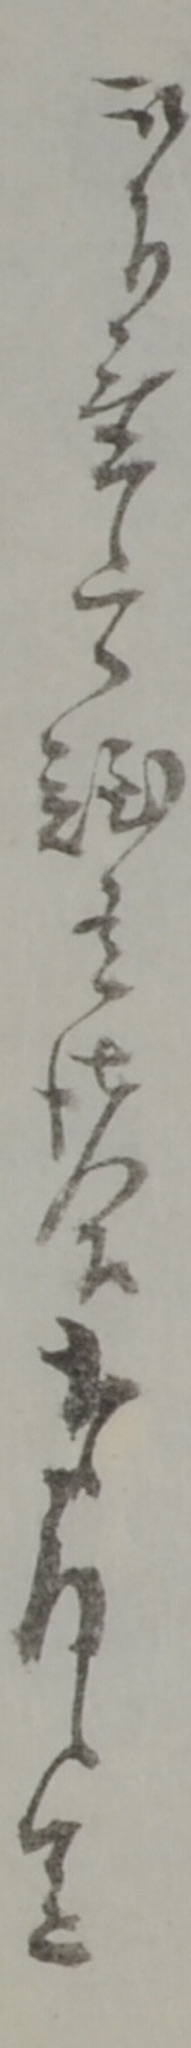被下置候ハヽ難有仕合奉存候以上
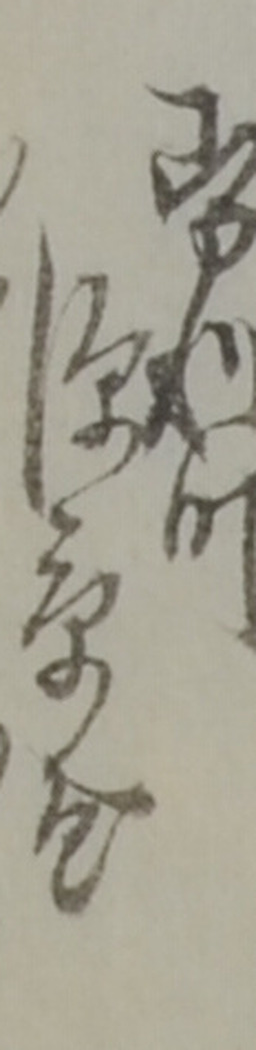深草屋
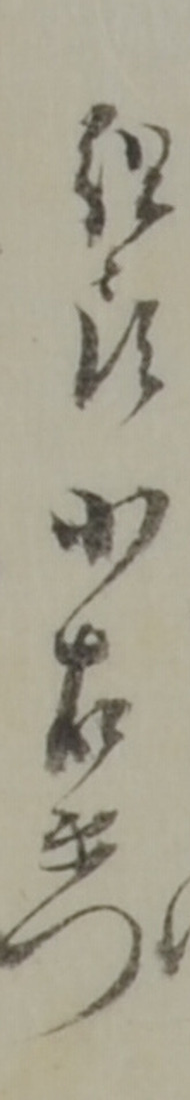組頭小右衛門
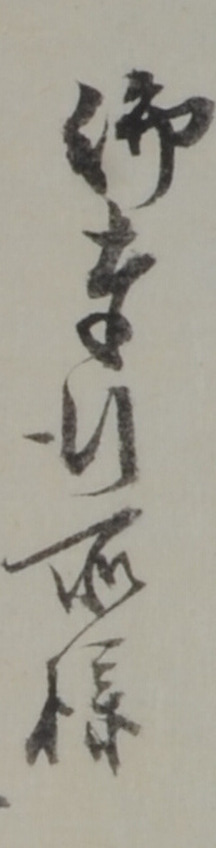御奉行所様
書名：諸願書控帳
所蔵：伊那市立高遠町図書館・合同会社AMANE
